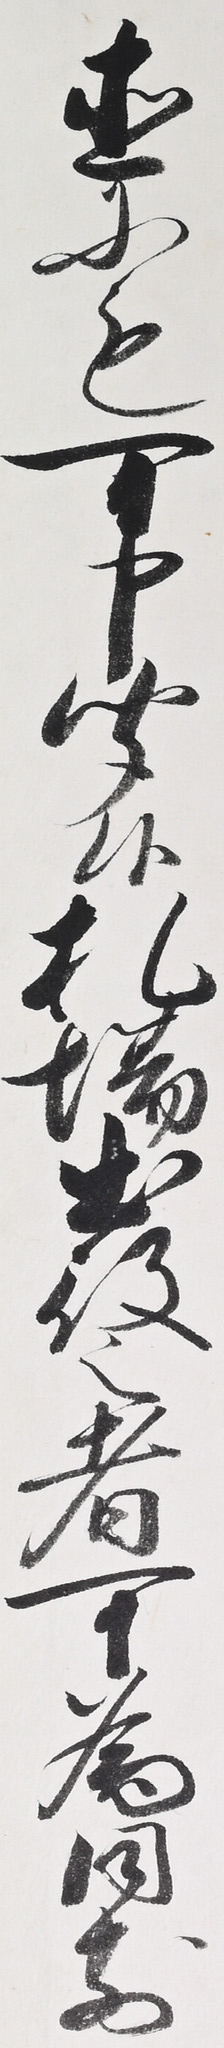直にも可申聞候札場出役之者可為同前
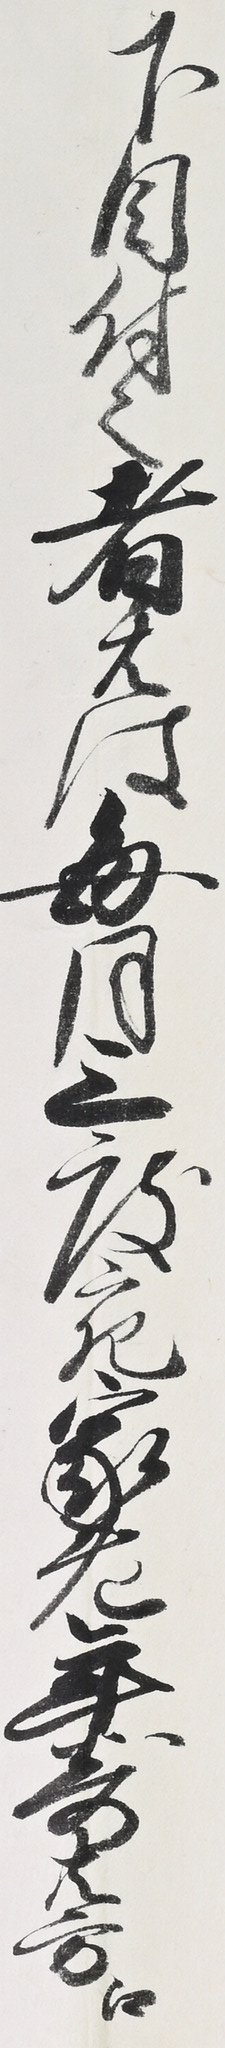下目付之者共は毎月三度宛家老年寄共方江
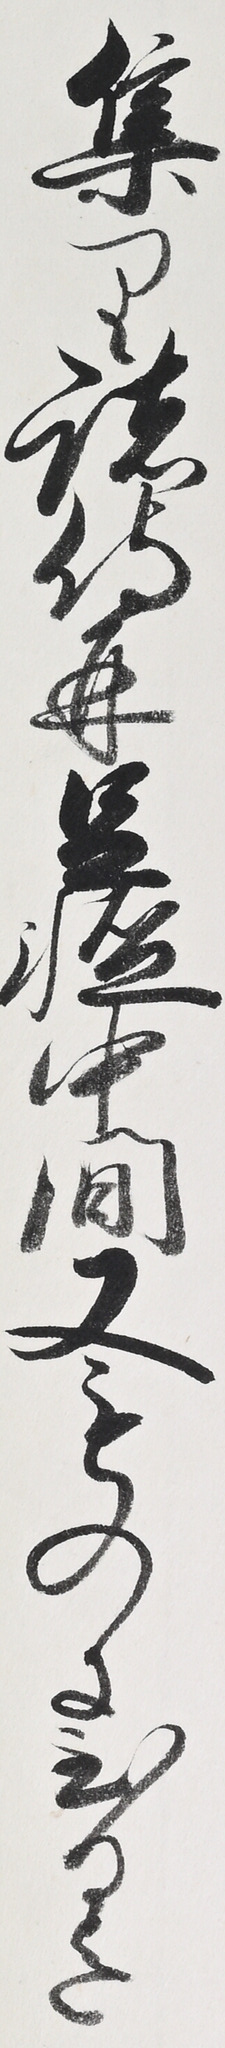集り諸侍并足軽中間又ものに至る迄
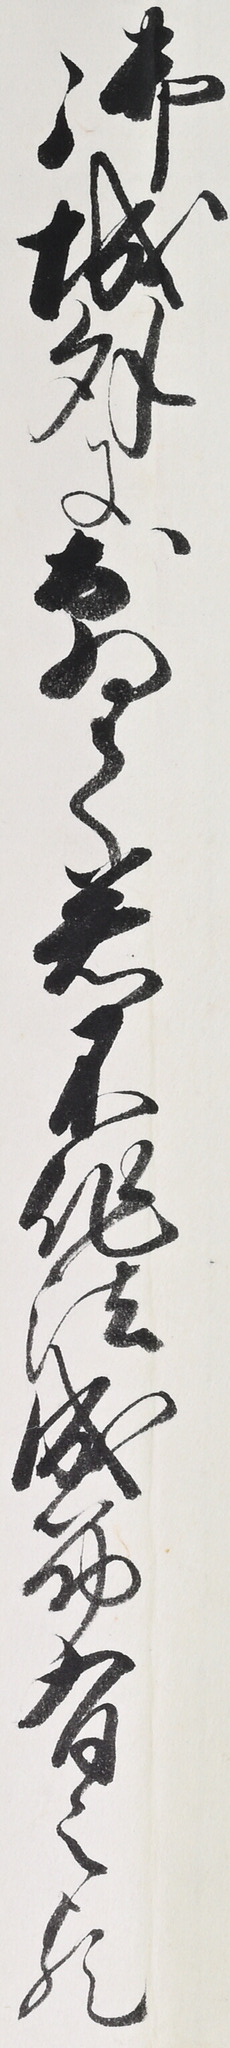御城外におゐて若不作法成筋有之歟
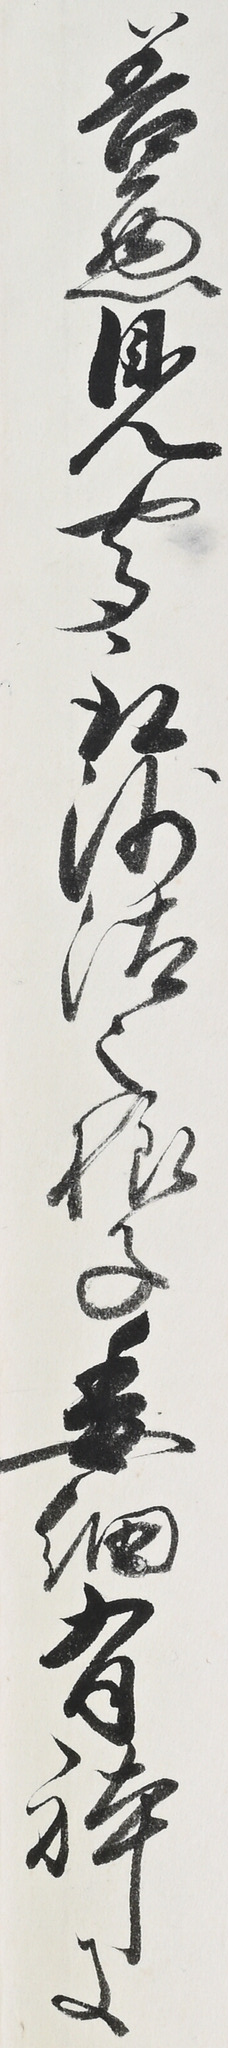善悪見聞取沙汰之様子委細有躰に
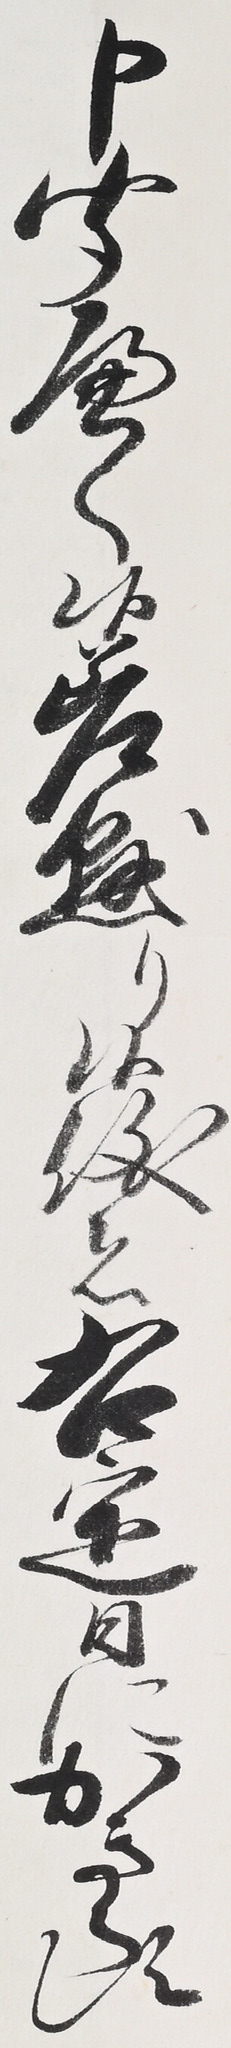申聞へく候差懸り候儀者右定日にかきらす
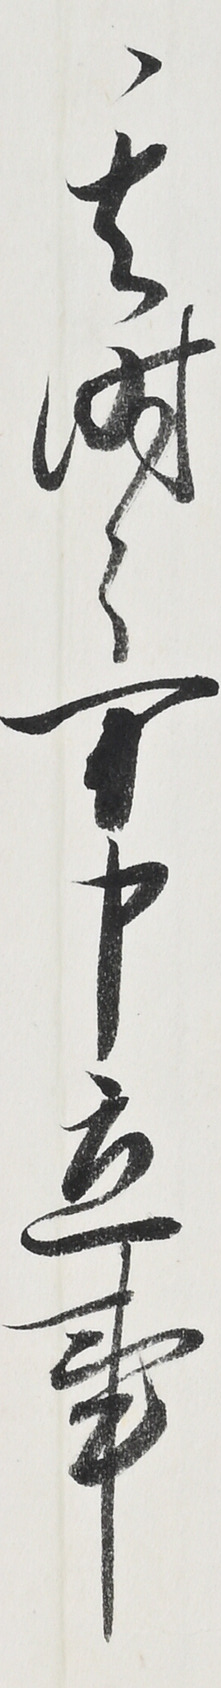其時々可申立事
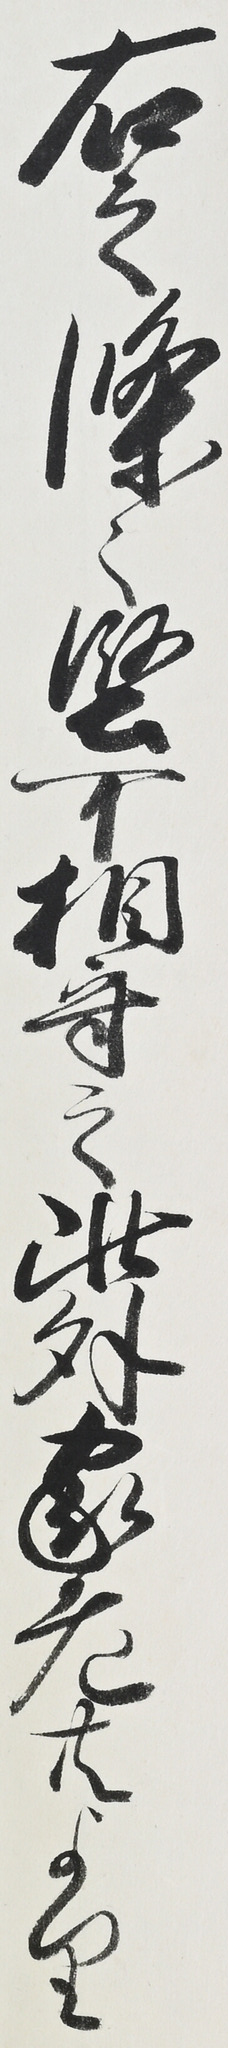右之條々堅可相守之此外家老共より
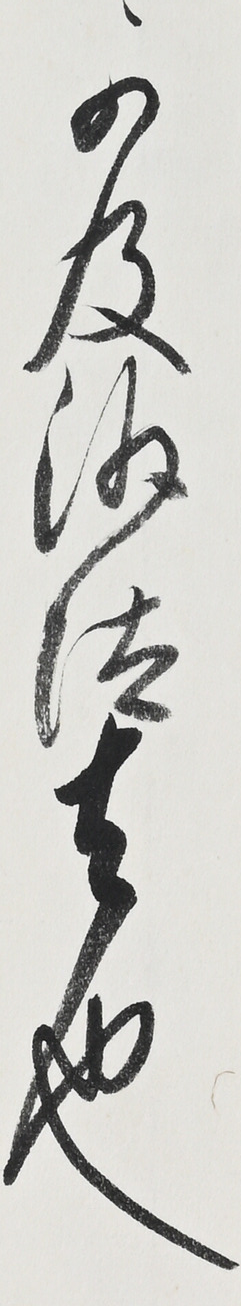可及沙汰者也
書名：御条目
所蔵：伊那市立高遠町図書館・合同会社AMANE
